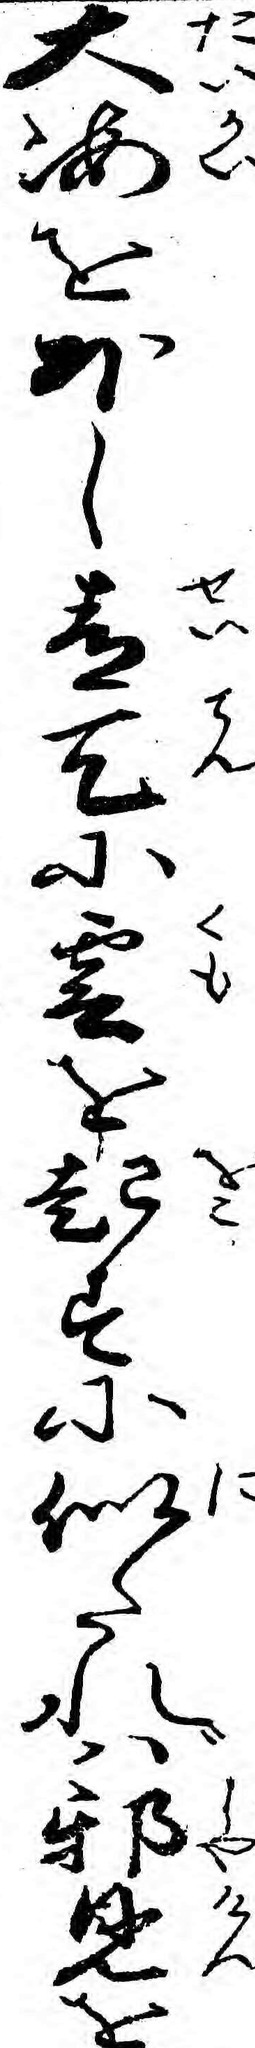大海をほし青天に雲を起すに似たれは邪見を
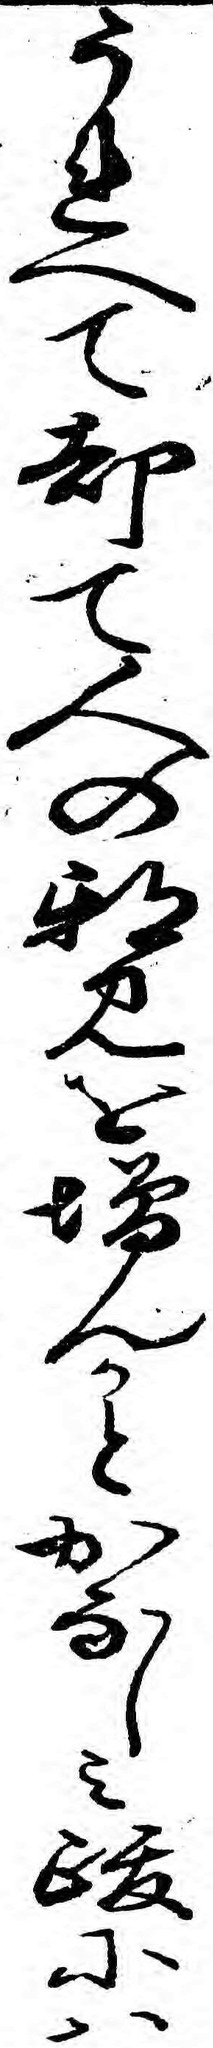うれへて却て人の邪見を増んかとかなしみ跋には
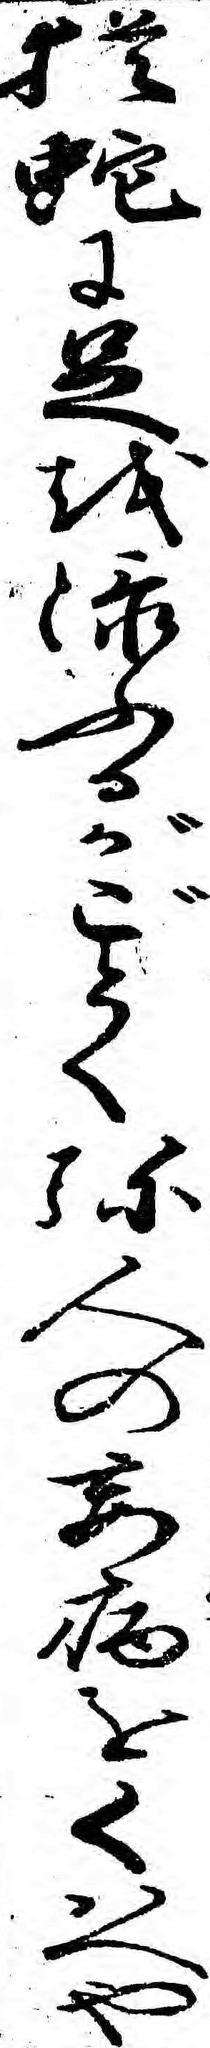猶蛇に足を添ふるがごとく弥人の妄病をくはへや

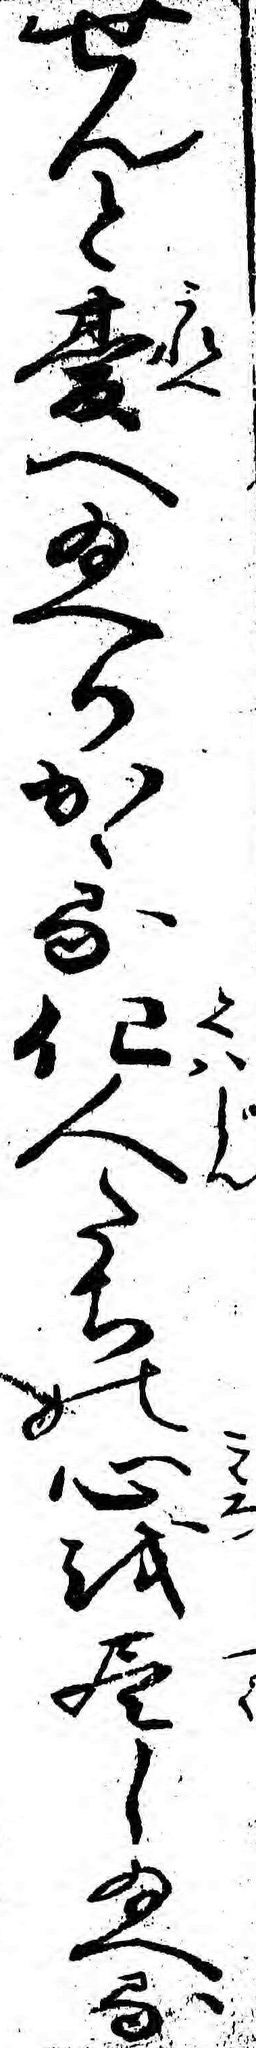せんと憂へ給へりかゝる化人たちの心を尽し給へる
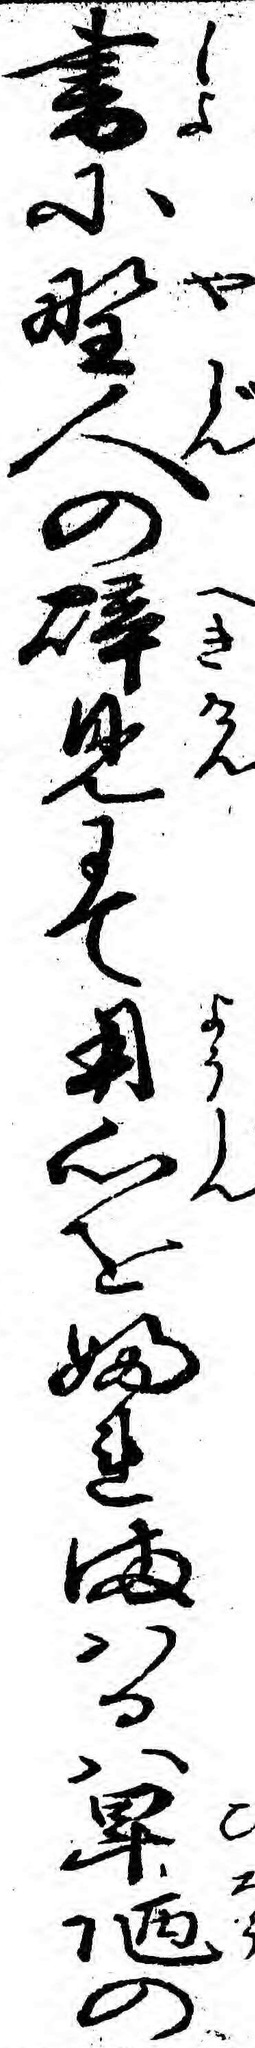書に野人の辟見にて用心をふれまはるは卑陋の
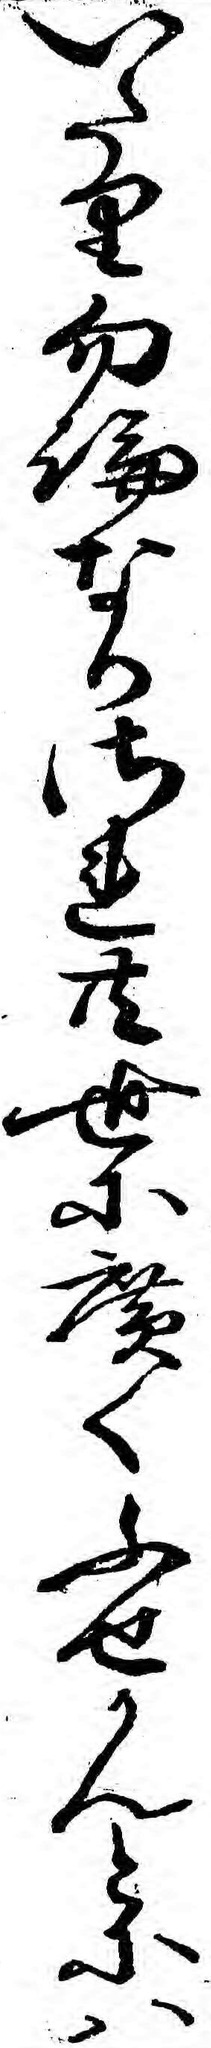いたり勿論なりされ共世に広くふせかんとには
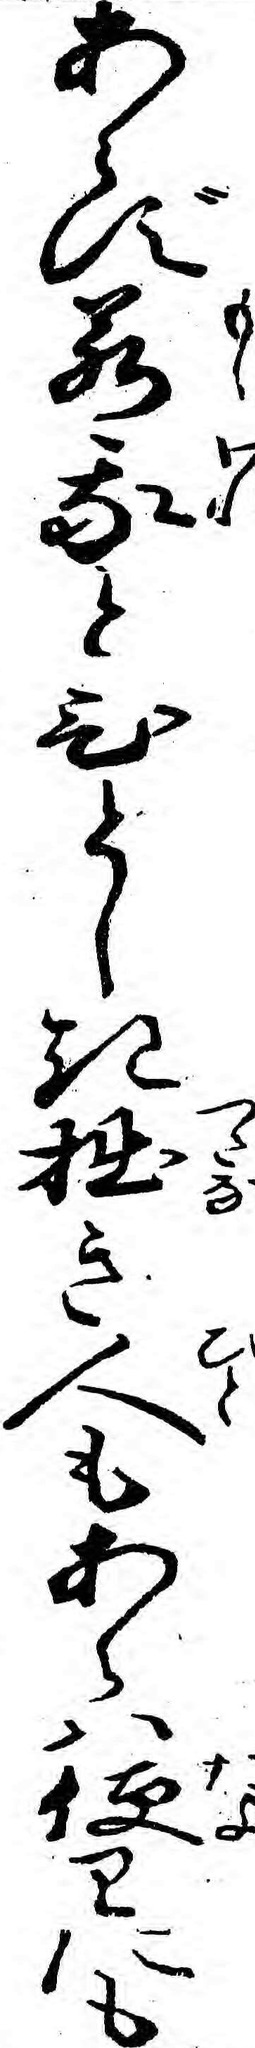あらず若我とひとしき拙き人もあらは便りにも
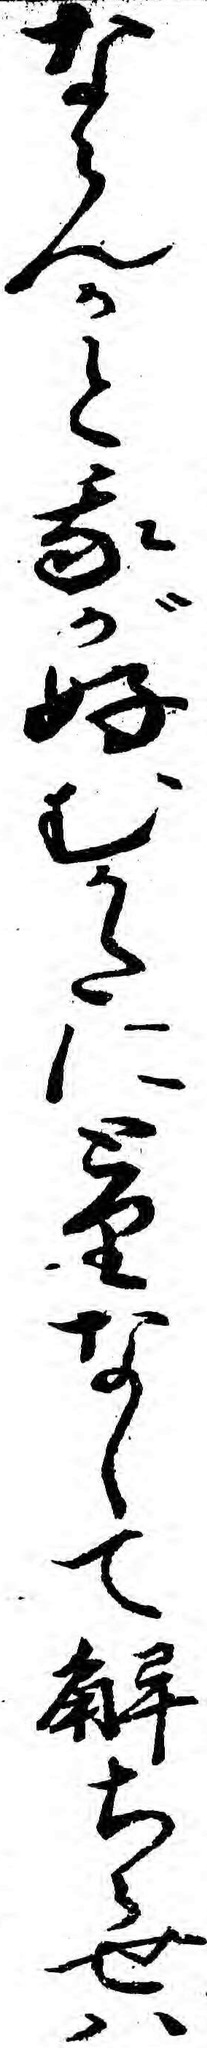ならんかと我が好むかたにとりなして解ちらせは
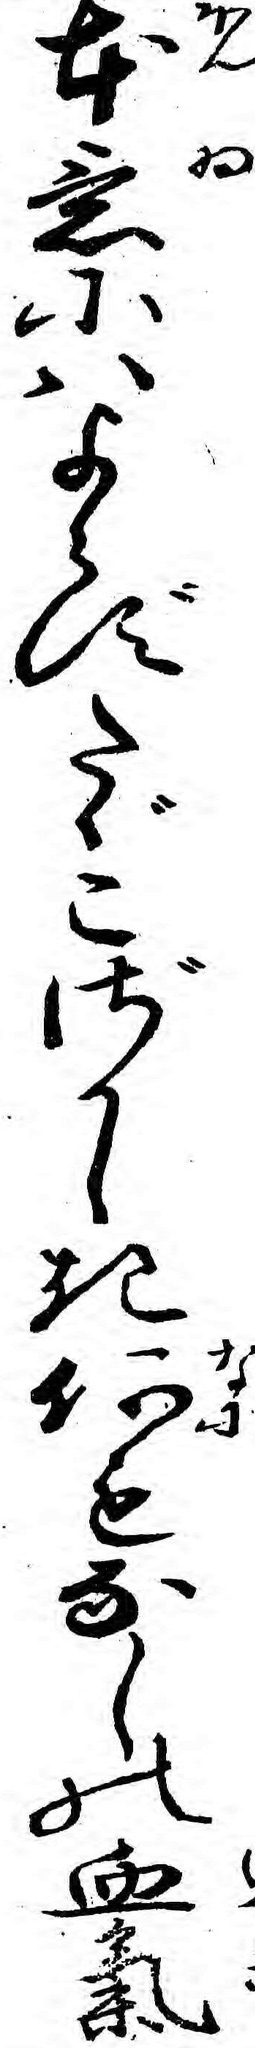本意にはよらずたゞこざかしき何もなしの血気
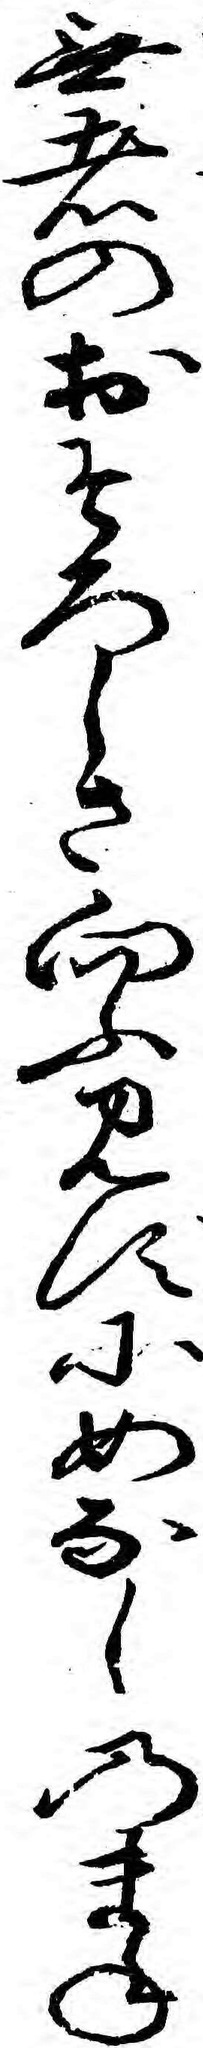無者のおそろしさ向ふ見ずにめなしのまね
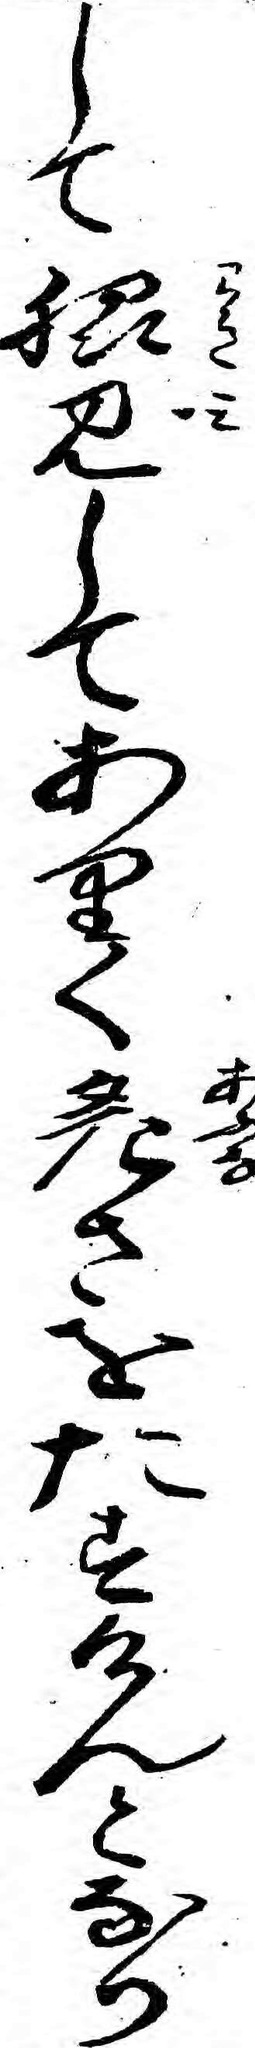して脇見してありく危さをたすけんとなり
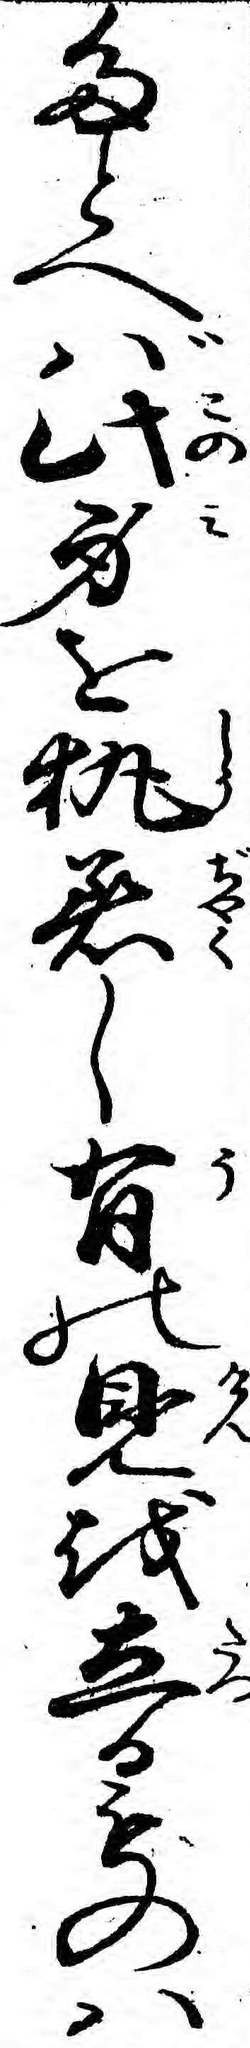たとへば此身を執着し有の見を立るものは
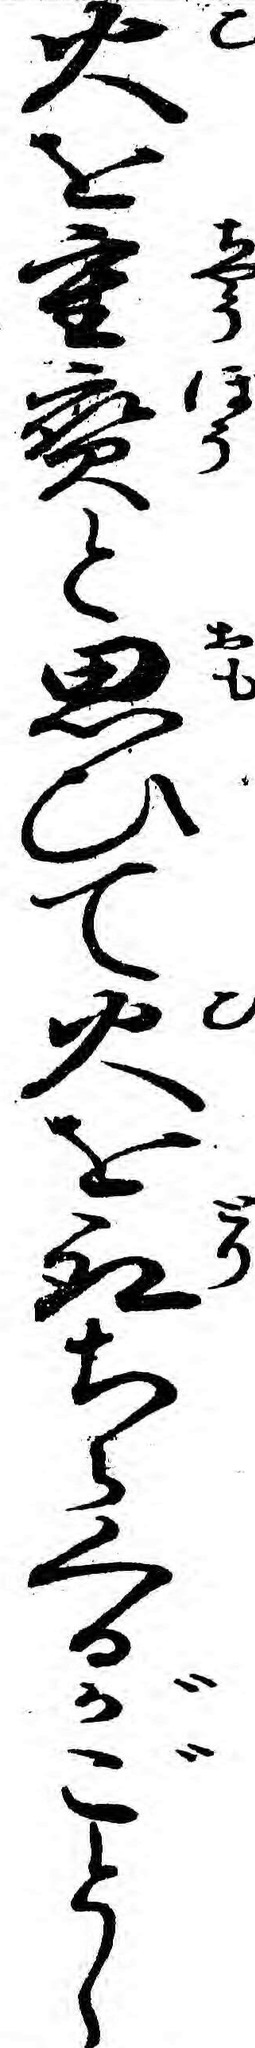火を重宝と思ひて火を取ちらくるがごとし
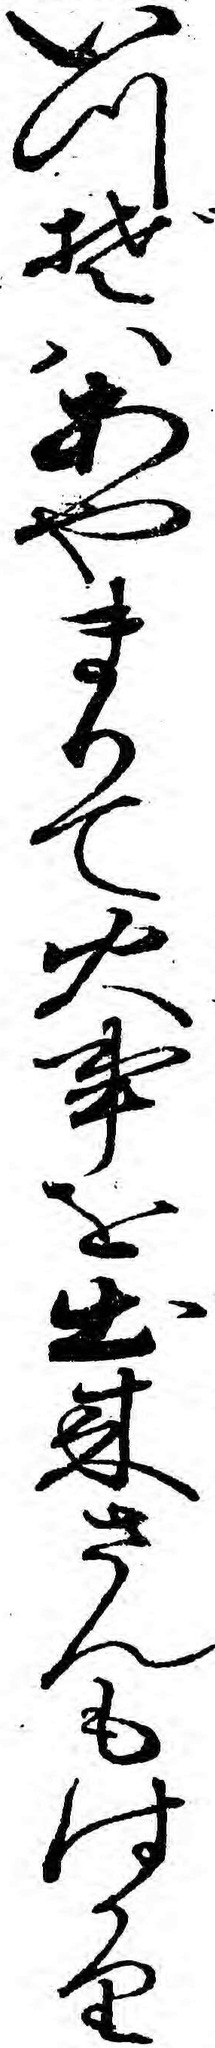いつぞはあやまりて火事を出来さんもはかり
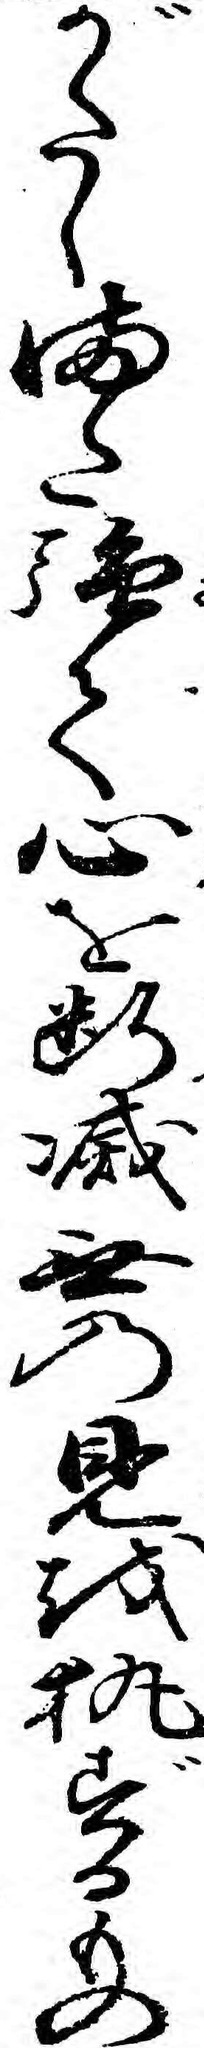がたしまた強て心を断滅無の見を執ずるもの
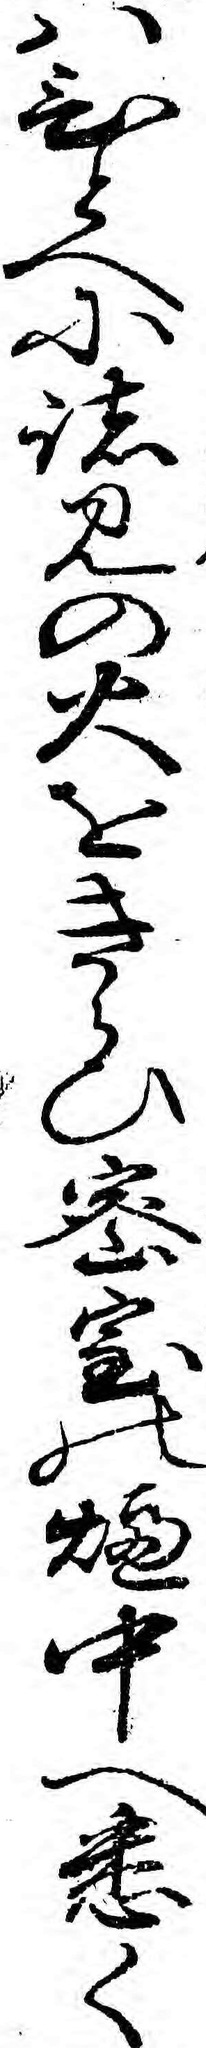はひとへに諸見の火をきらひ密室の炉中へ悉く
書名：目なし用心抄
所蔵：国文学研究資料館
